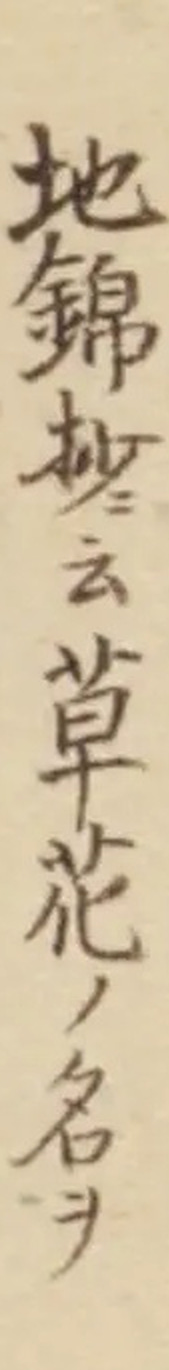地錦抄に云草花の名を

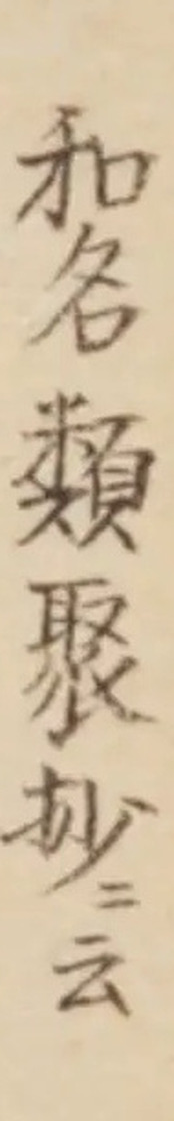和名類聚抄ニ云
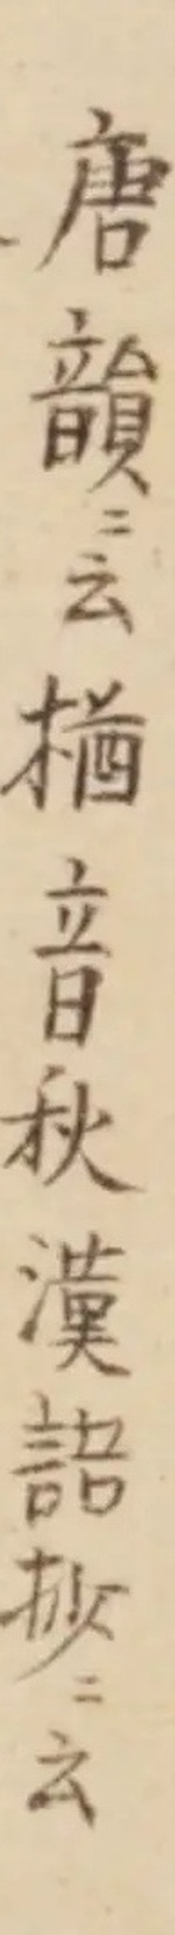楢唐韻云楢音秋漢語抄に云
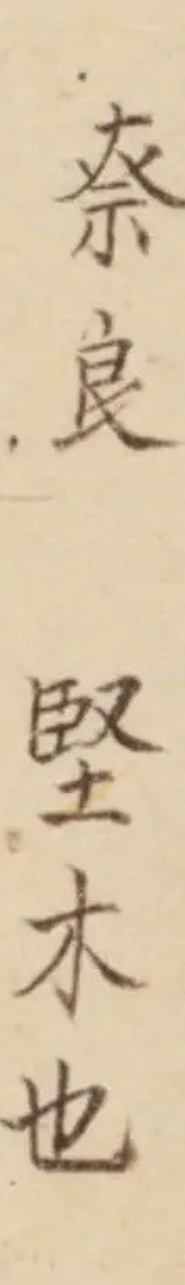奈良堅木也
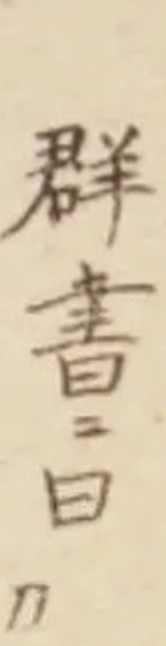群書に曰
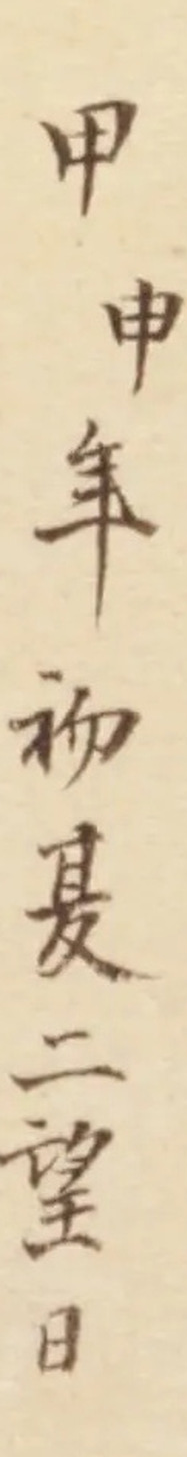甲申年初夏二望日
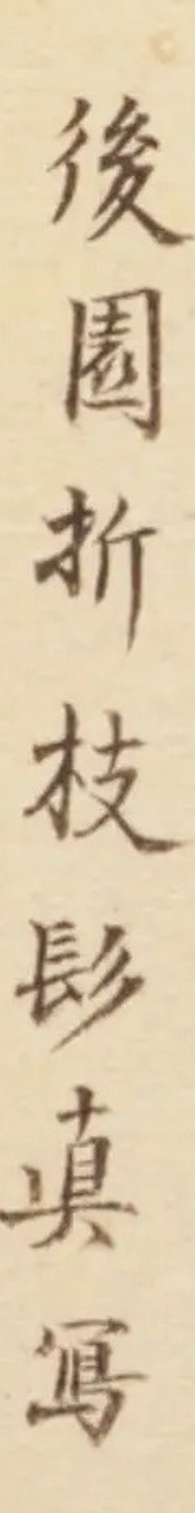後園折枝髟真寫
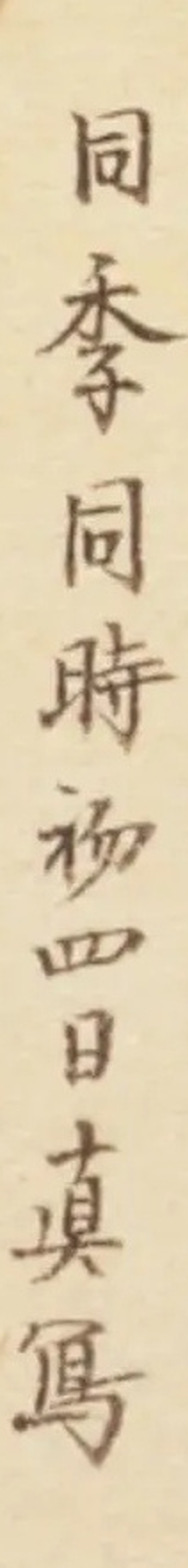同季同時初四日真寫
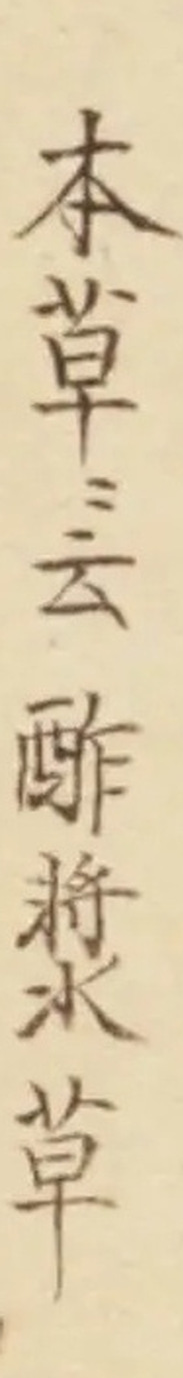本草に云酢漿草
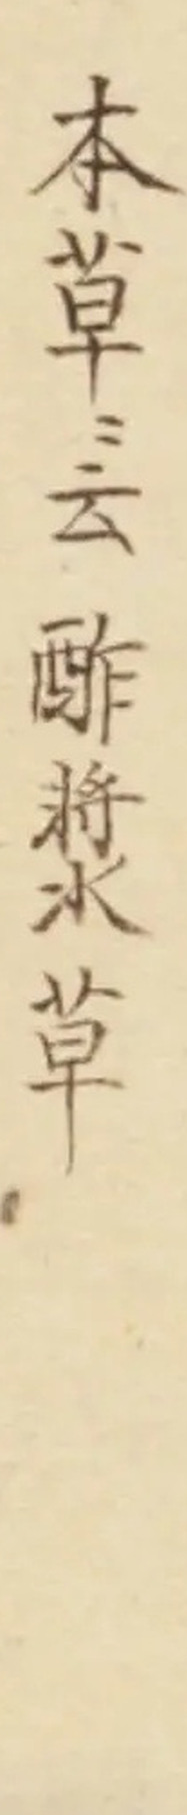本草に云酢漿草
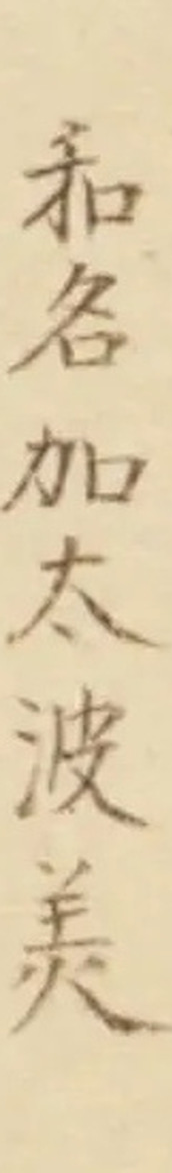和名加太波美
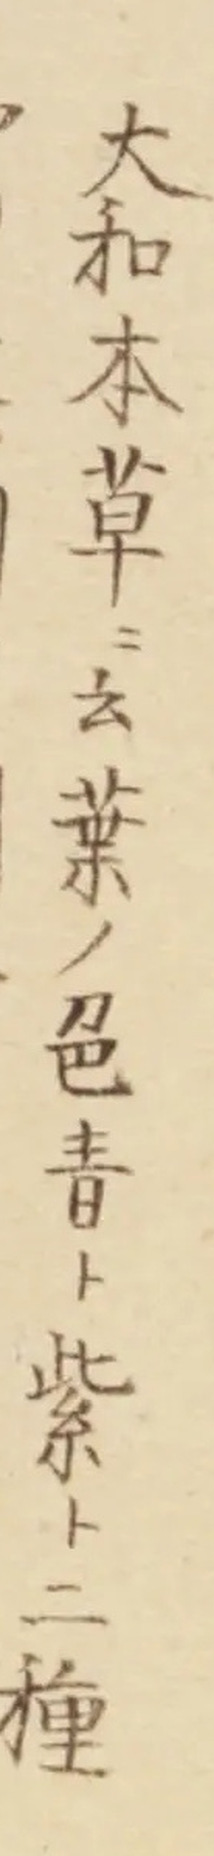大和本草に云葉の色青と紫と二種
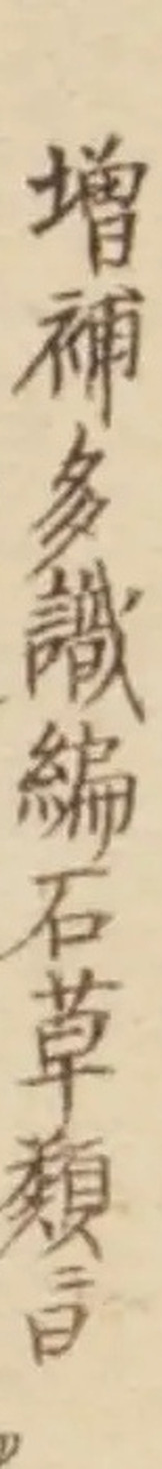増補多識編石草類ニ曰

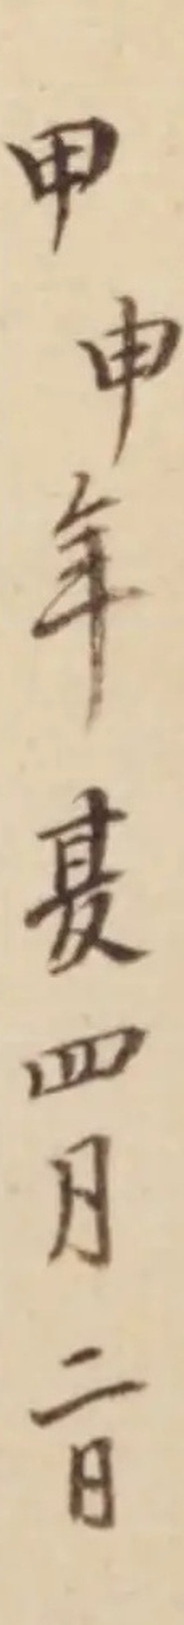甲申年夏四月二日
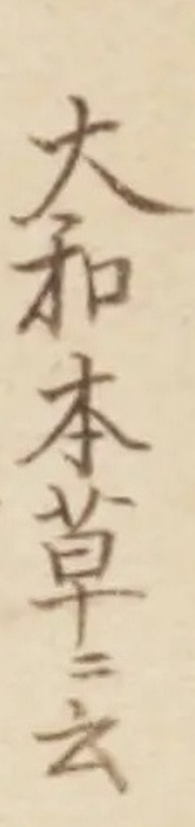大和本草に云
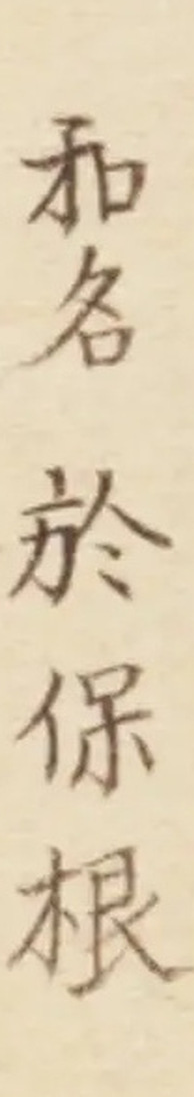和名於保根
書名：梅園草木花譜夏之部. 2
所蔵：国立国会図書館 National Diet Library, JAPAN
